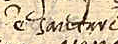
ē santarē
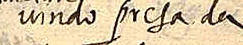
uindo presa da
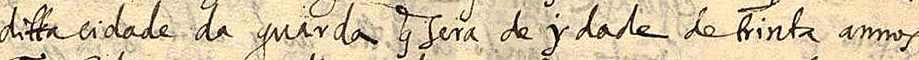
ditta cidade da guarda q̄ sera de ydade de trinta annos
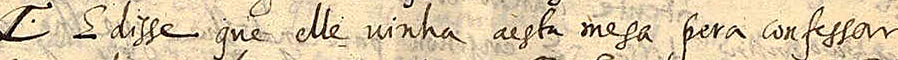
¶ E disse que elle uinha a esta mesa pera confessar
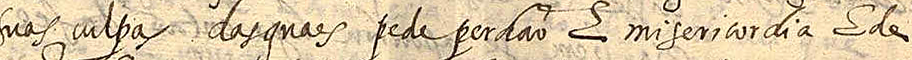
suas culpas das quaes pede perdaõ E misericordia E de
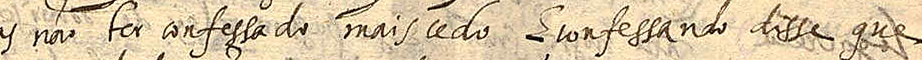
as não ter confessado mais cedo E confessando disse que
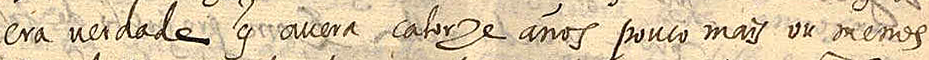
era uerdade q̄ auera catorze an̄os pouco mais ou menos
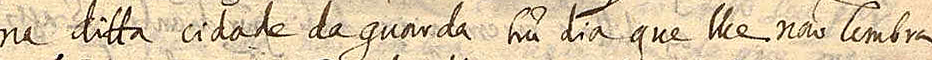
na ditta cidade da guarda hū dia que lhe naõ lembra
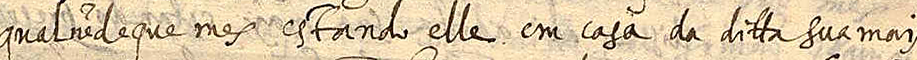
qual nē de que mes estando elle em casa da ditta sua may
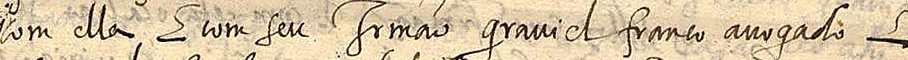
com ella E com seu Jrmão grauiel franco auogado E
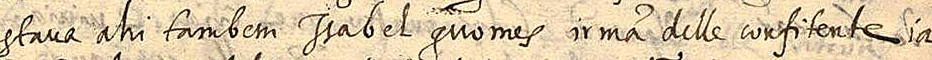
estaua ahi tambem Jsabel guomes irmā delle confitente ia
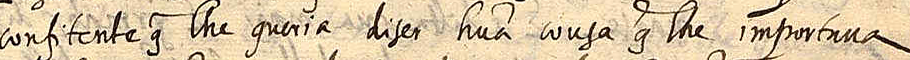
confitente q̄ lhe queria diser huā cousa q̄ lhe importaua
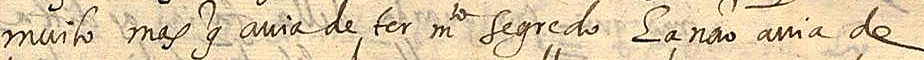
muito mas q̄ auia de ter mto segredo E a naõ auia de
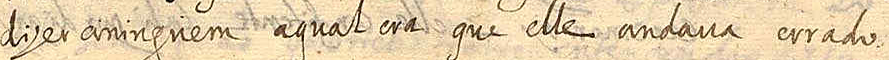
dizer a ninguem a qual era que elle andaua errado
